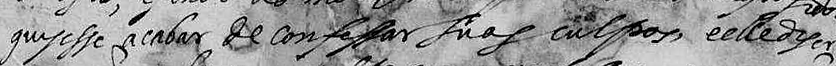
quisesse acabar de confessar suas culpas, e elle diser
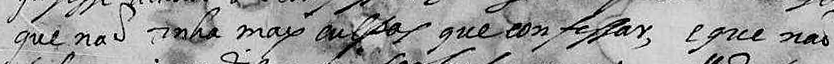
que naõ tinha mais culpas que confessar, e que naõ
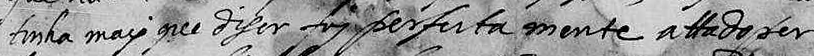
tinha mais que dizer foj perfeitamente attado per
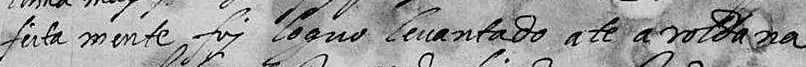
feitamente foj loguo leuantado ate a roldana
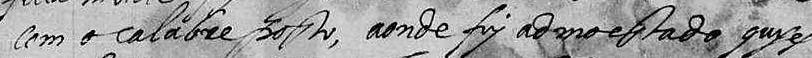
com o calabre posto, aonde foj admoestado quises
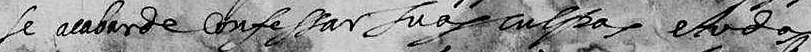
se acabar de confessar suas culpas e todas
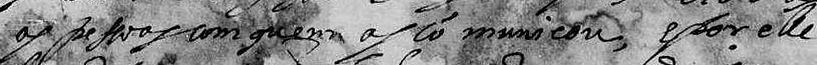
as pessoas com quem as cōmunicou, e por elle
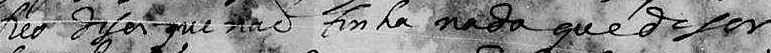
Reo diser que naõ tinha nada que diser
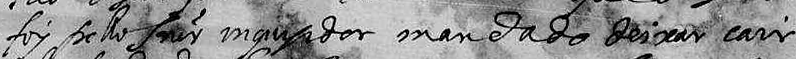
foy pello snor̄ inquisidor mandado deixar cair
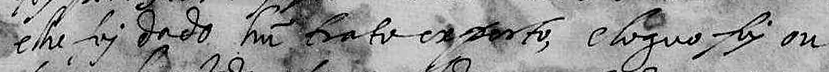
e lhe foj dado hū trato experto, e loguo foy ou
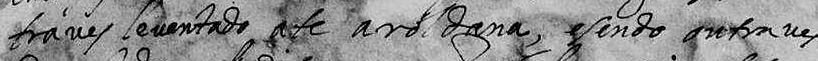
tra ues leuantado ate a roldana, sendo outra ues
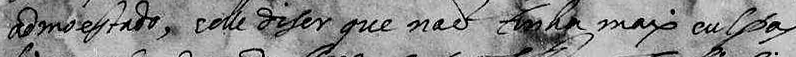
admoestado, E elle diser que naõ tinha mais culpas
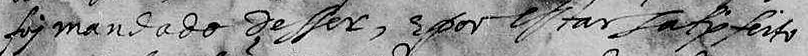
foj mandado desser, E por estar satisfeito
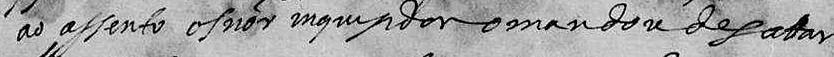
ao assento o snōr inquisidor o mandou desattar
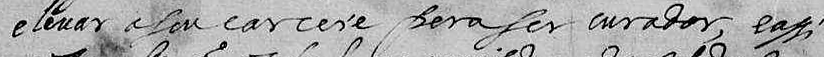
e leuar a seu carcere pera ser curador, E assi
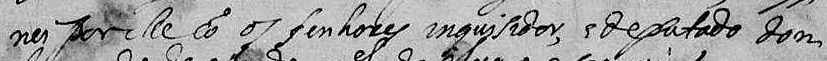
nei por elle cō os senhores inquisidor, E deputado don
